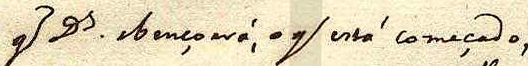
q̄ Ds. abençoará, o q̄ está começado,
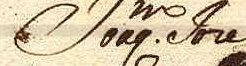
Ioaq.m Ioze
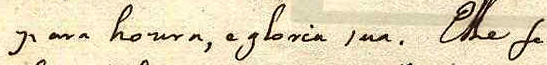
para honra, e gloria sua. Elhe fe
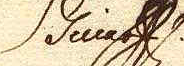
Guiaõ
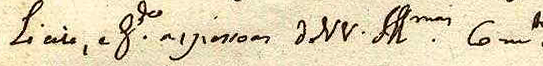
Licita, e G.de as pessoas de VV. Ill.mas Com.to
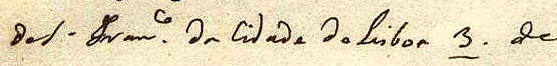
de S. Fran.co da Cidade de Lisboa 3. de
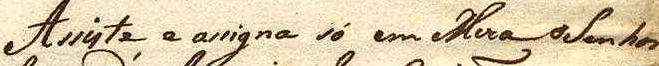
Assiste, e assigna só em Meza o Senhor
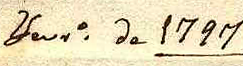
Fevr.o de 1797
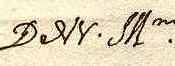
De VV. Ill.mas
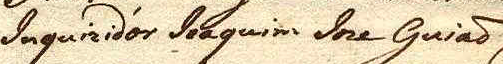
Inquizidor Ioaquim Ioze Guiaõ
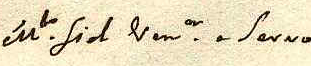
M.to fiel Ven.or e Servo
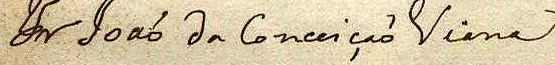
Fr Ioaõ da Conceiçaõ Viana
